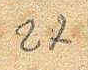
27
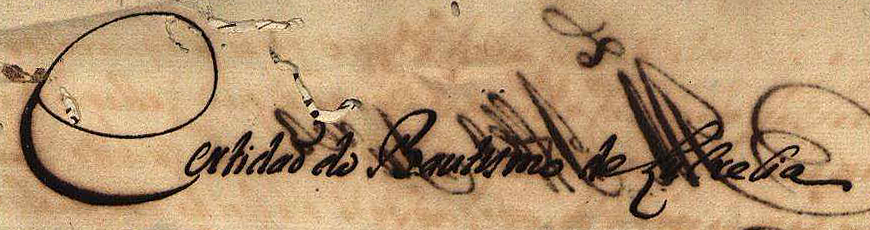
Certidaõ do Bautismo de LuCreCia
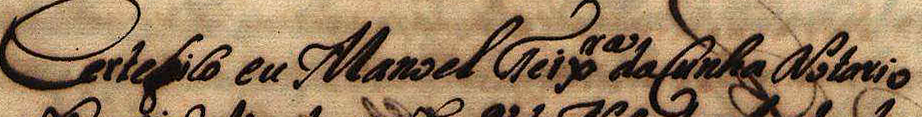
CertefiCo eu Manoel Teixra da Cunha Notario
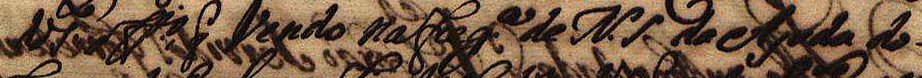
do s.to offo q̄ Vendo na freg.a de N. s. da Ajuda do
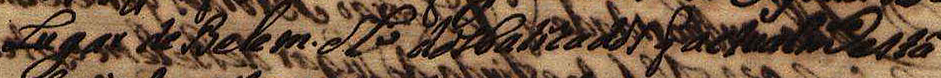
Lugar de Belem. o L.o dos batizados q̄ actualmte está
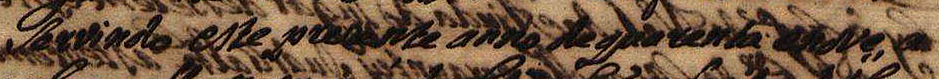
servindo este prezente anno de quarenta e nove, a
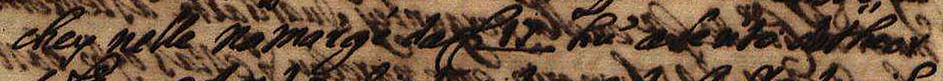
chei nelle na marge da f̄17 hū asento de theor
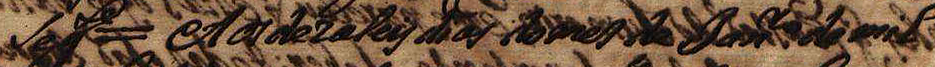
segte = Aos dezaseis dias do mes de Ian.ro de mil
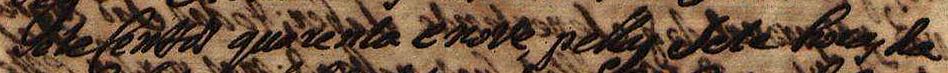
seteCentos quarenta e nove pellas sete horas da
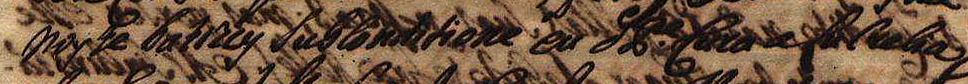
noyte batizey Sub Conditione eu o P.e Cura a LuCreCia
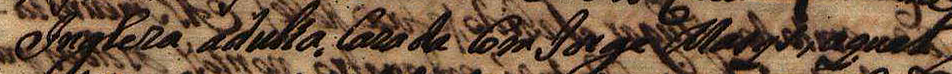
Ingleza adulta, Cazada com Iorge Masqs, a qual
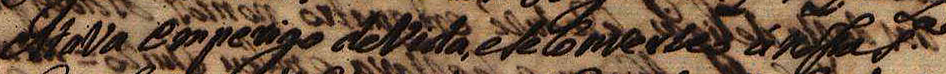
estava em perigo de Vida, e se converteo a nossa s.ta
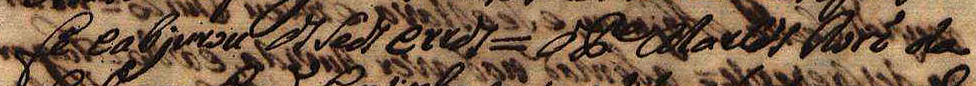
fe e abjurou os seos erros = O P.e Marcos Rorz̄ da
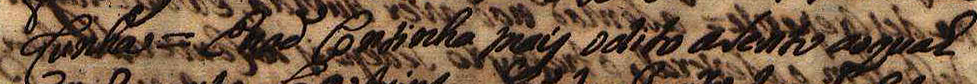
Cunha = E naõ Continha mais o dito asento ao qual
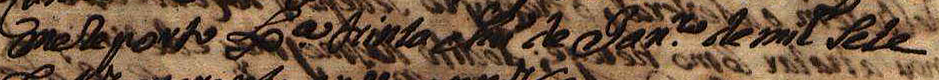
me Reporto Lx.a trinta e hu de Ian.ro de mil sete
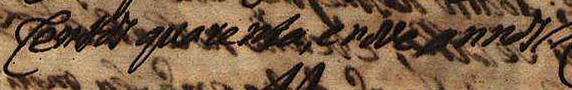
Centos quarenta e nove annos//
